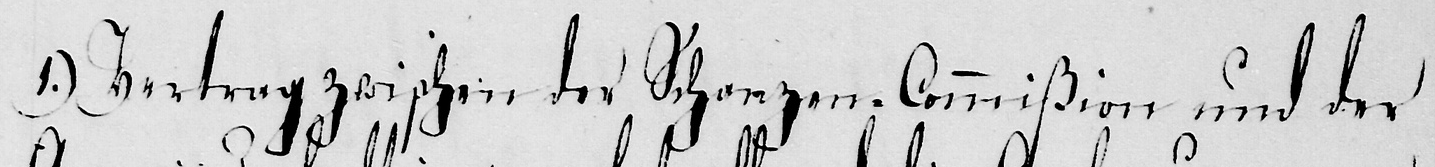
1.) Vertrag zwischen der Schanzen-Commißion und der
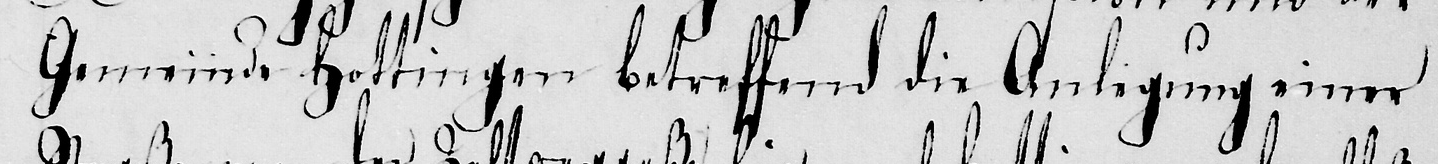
Gemeinde Hottingen betreffend die Anlegung einer
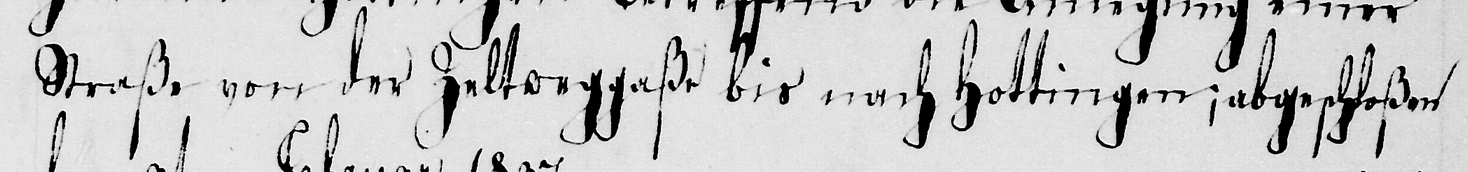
Straße von der Zeltweggaße bis nach Hottingen; abgeschloßen
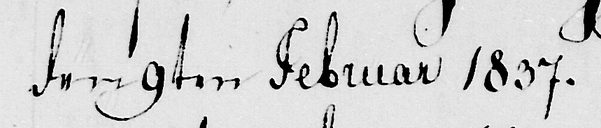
den 9ten Februar 1837.
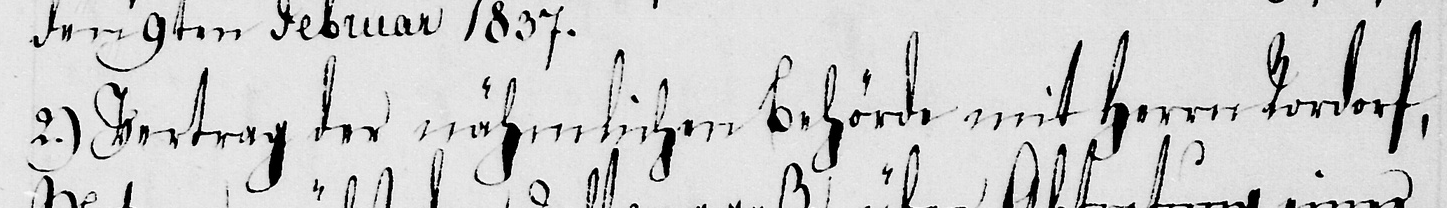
2.) Vertrag der nähmlichen Behörde mit Herrn Rordorf,
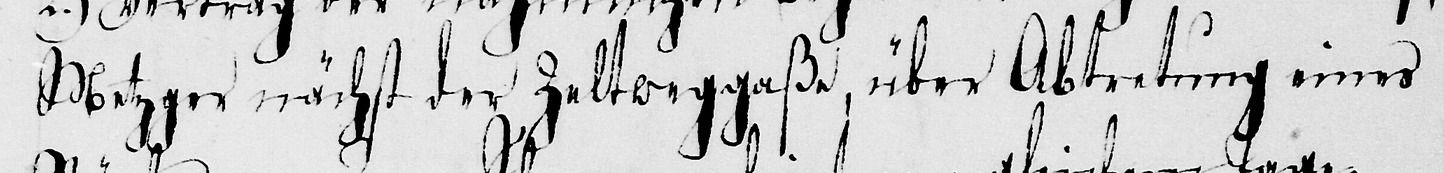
Metzger nächst der Zeltweggaße, über Abtretung eines
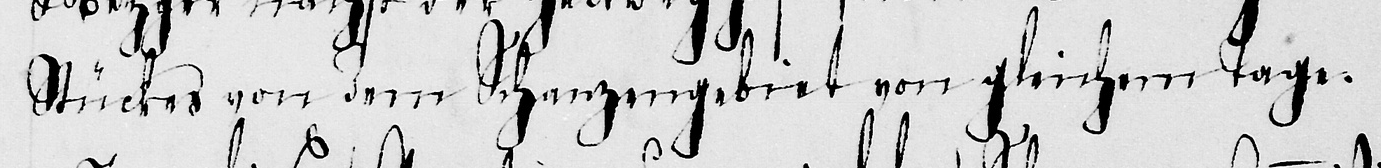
Stückes von dem Schanzengebiet von gleichem Tage.
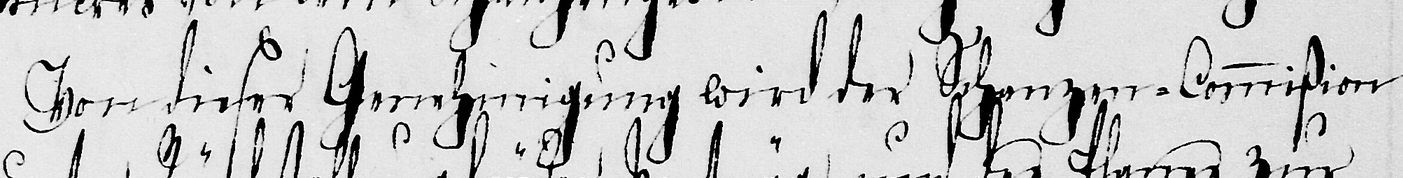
Von dieser Genehmigung wird der Schanzen-Commißi¬
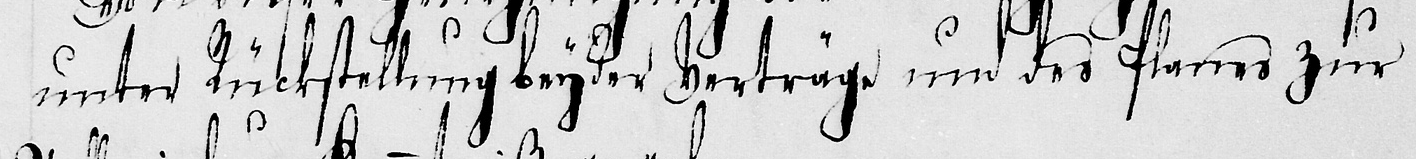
unter Rückstellung beyder Verträge und des Planes zur
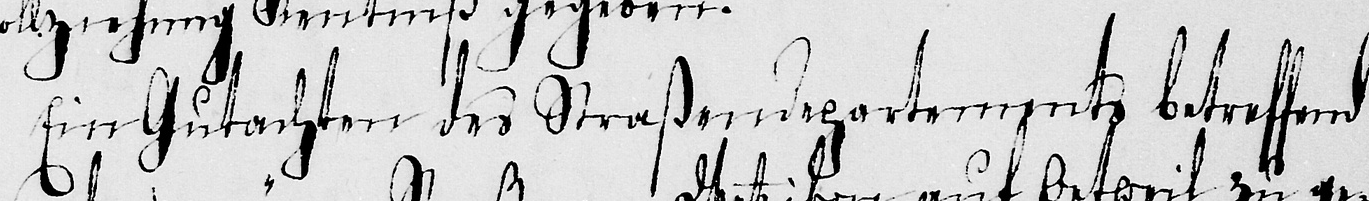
Ein Gutachten des Straßendepartements betreffe¬
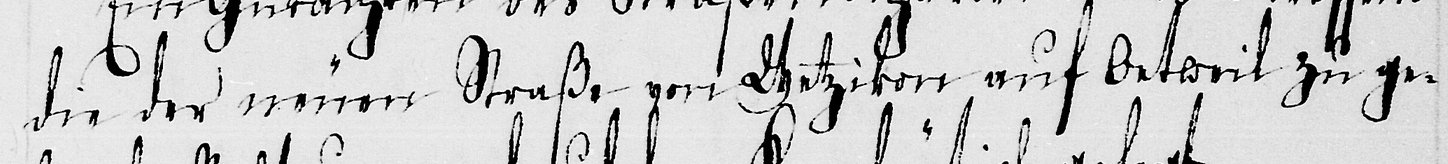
die der neuen Straße von Wetzikon auf Oetweil zu ge¬
